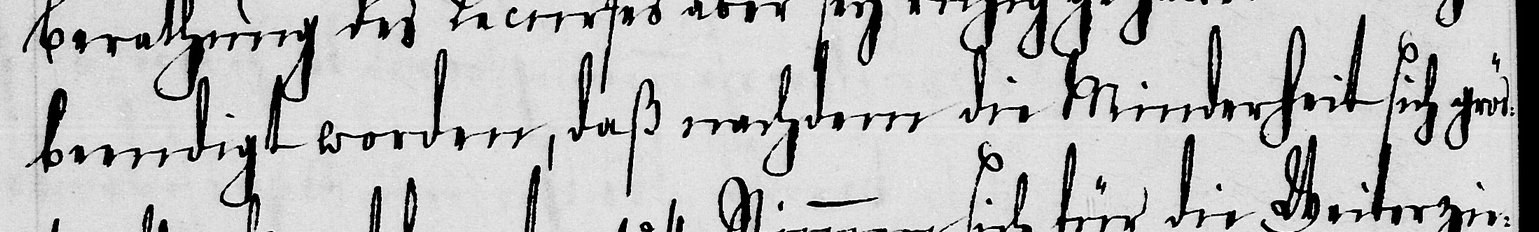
beendigt worden, daß nachdem die Minderheit sich gr¬
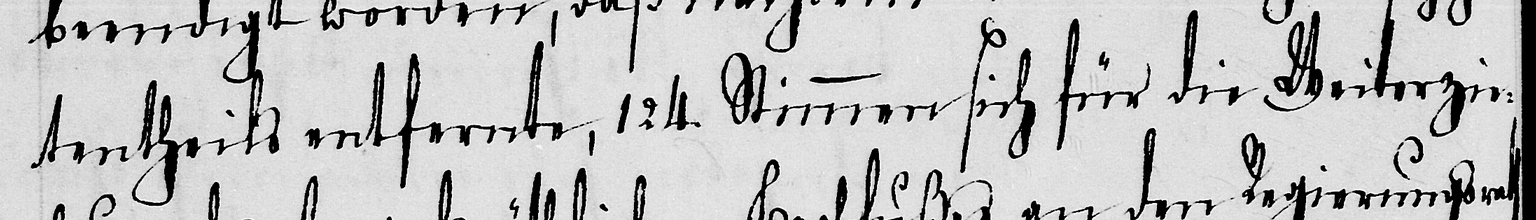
tentheils entfernte, 124. Stimmen sich für die Weiterzie¬
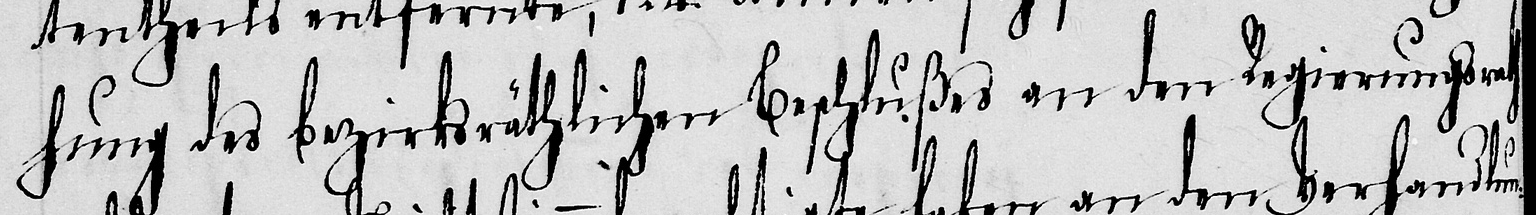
hung des bezirksräthlichen Beschlußes an den Regierungsr¬
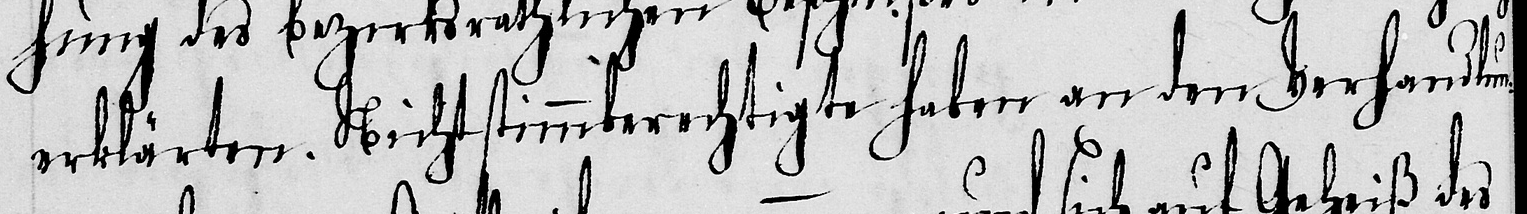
erklärten. Nichtstimmberechtigte haben an den Verhandlun¬
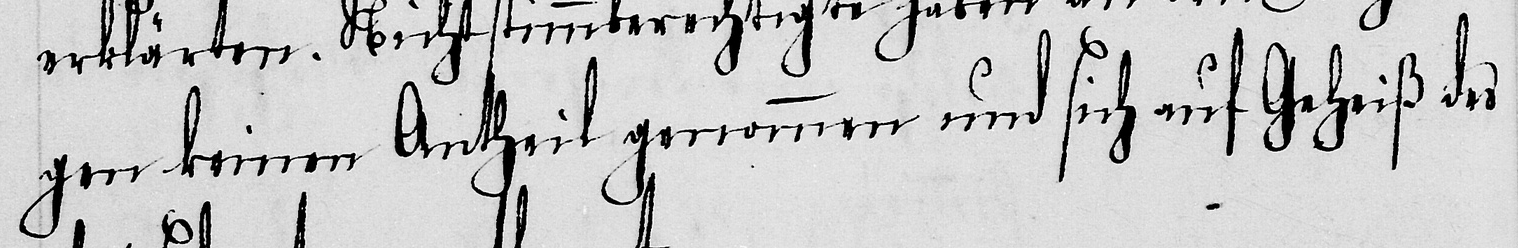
gen keinen Antheil genommen und sich auf Geheiß des
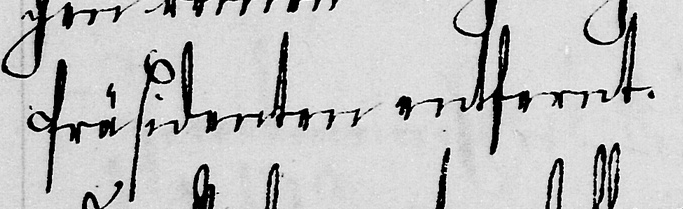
Präsidenten entfernt.
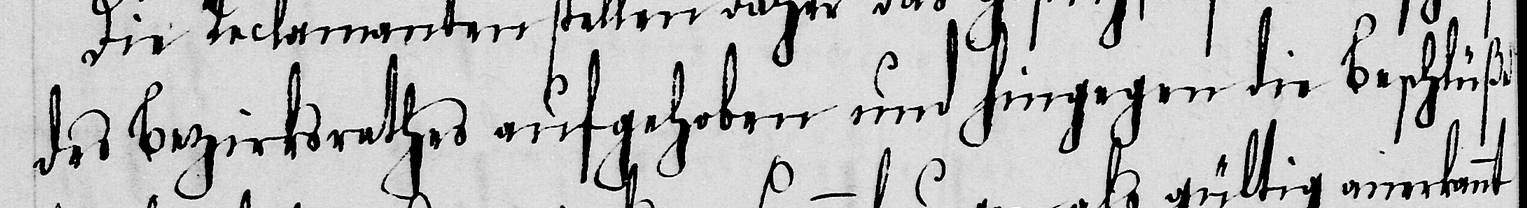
des Bezirksrathes aufgehoben und hingegen die Beschlüße
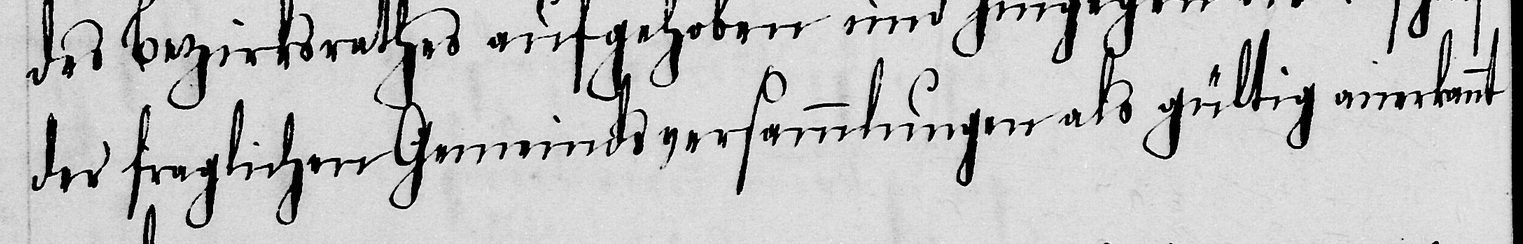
der fraglichen Gemeindsversammlungen als gültig anerkan¬
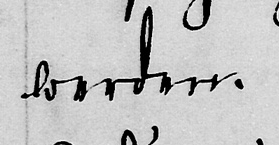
werden.
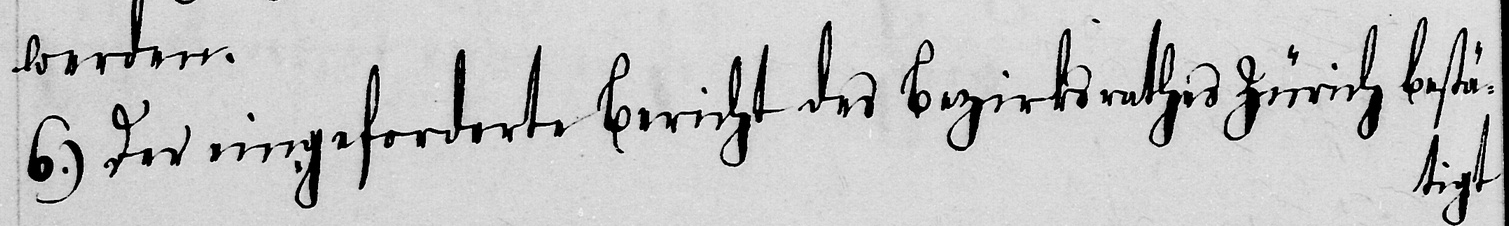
6.) Der eingeforderte Bericht des Bezirksrathes Zürich best¬
